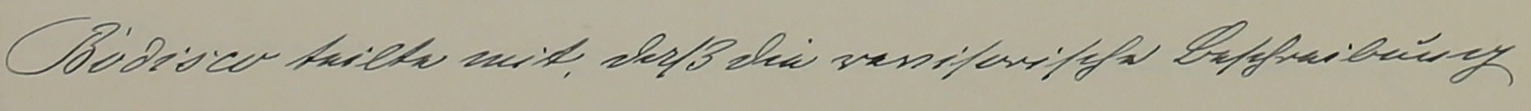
Bodisco teilte mit, daß die revisorische Beschreibung
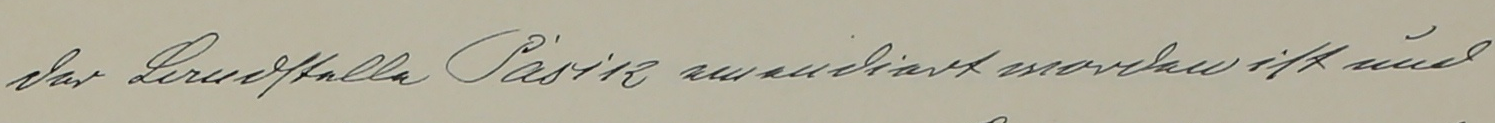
der Landstelle Pasik emandiert worden ist und
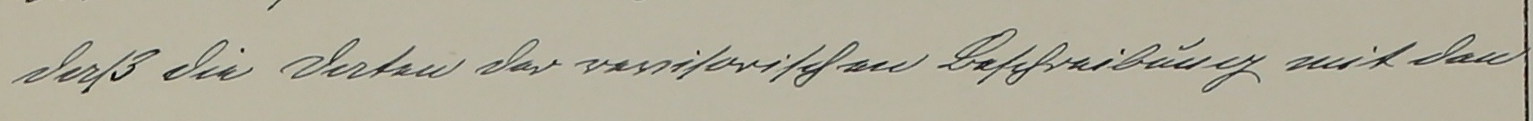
daß die Daten der revisorischen Beschreibung mit den
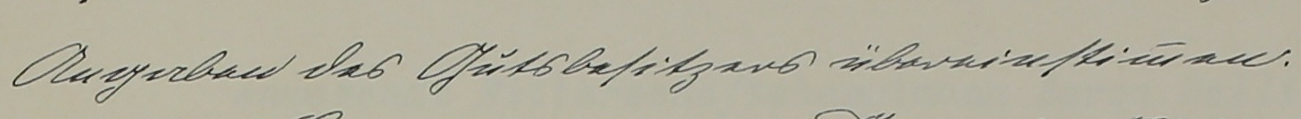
Angaben des Gutsbesitzers übereinstimmen.
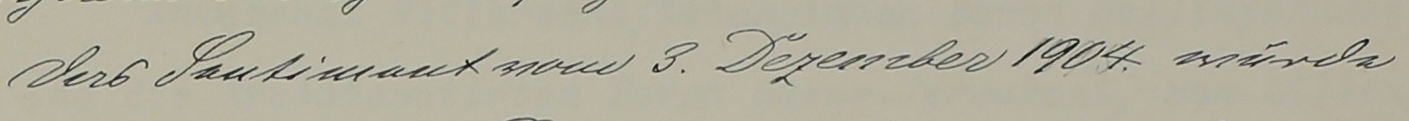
Das Sentiment vom 3. Dezember 1904. wurde
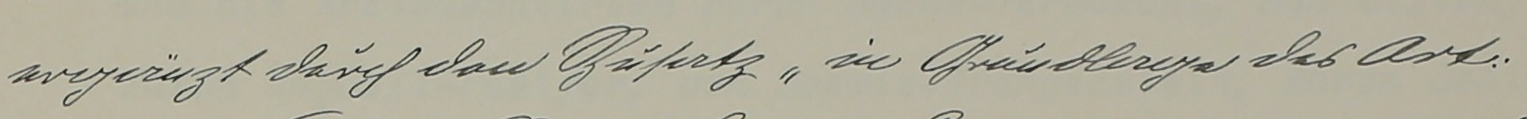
ergänzt durch den Zusatz „in Grundlage des Art.
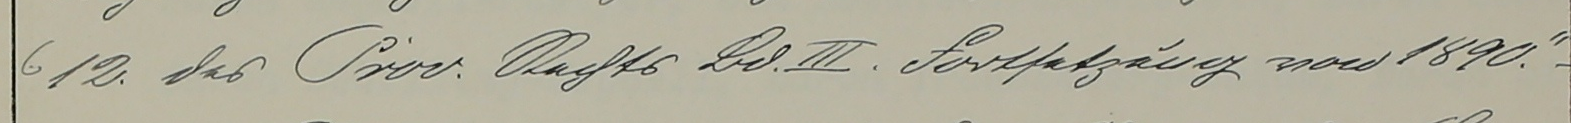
612 des Prov. Rechts Bd. III. Fortsetzung von 1890.“
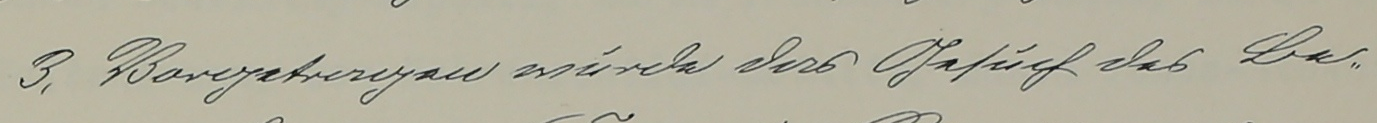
3. Vorgetragen wurde das Gesuch des Be-
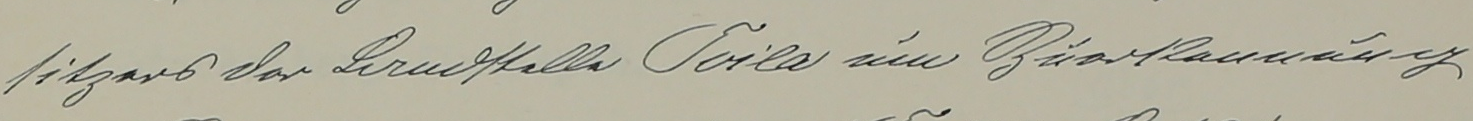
sitzers der Landstelle Toila um Zuerkennung
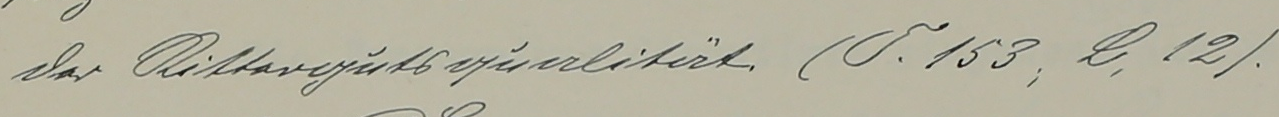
der Rittergutsqualität. (T.153; L.12).
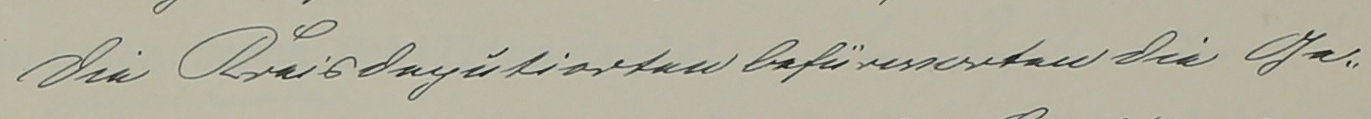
Die Kreisdeputierten befürworten die Ge-
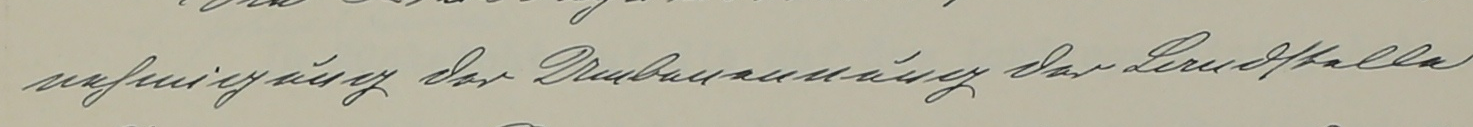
nehmigung der Umbenennung der Landstelle
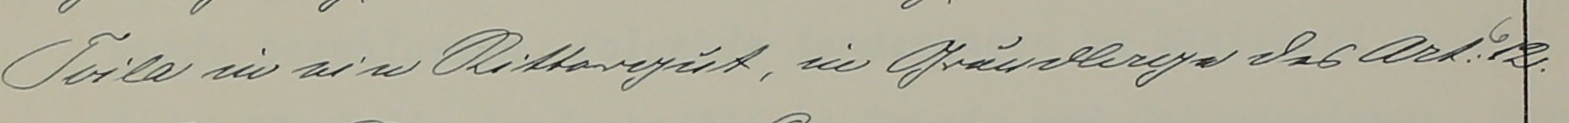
Toila in ein Rittergut, in Grundlage des Art. 612.
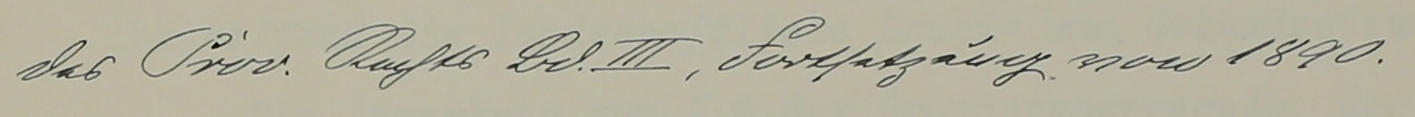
des Prov. Rechts Bd. III, Fortsetzung von 1890.
